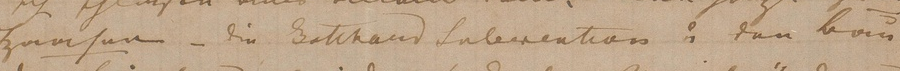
Haasen – die Gotthard Subvention u den Bau
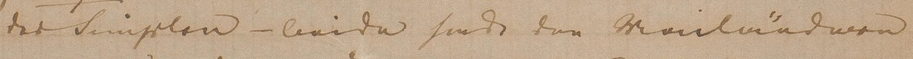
des Simplon – beide sind den Mailändern
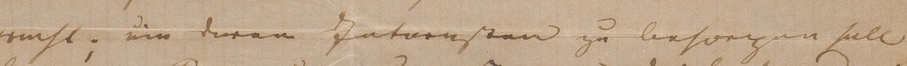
recht; um deren Intereßen zu besorgen soll
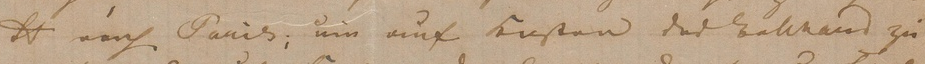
St nach Paris; um auf Kosten des Gotthard zu
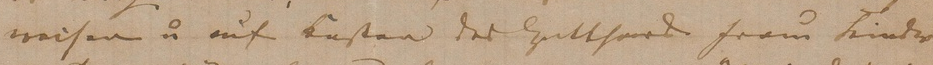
reisen u auf Kosten des GotthardFrauKinder
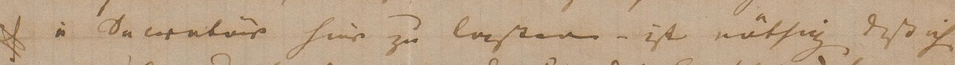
u Secretär hier zu laßen – ist nöthig daß ich
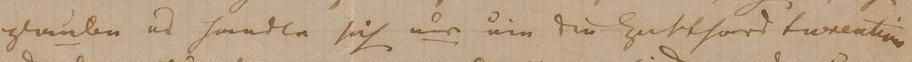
glaube es handle sich nur um die Gotthard Suvention
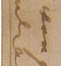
sich
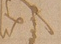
Bau des
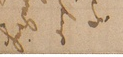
Frankreich
